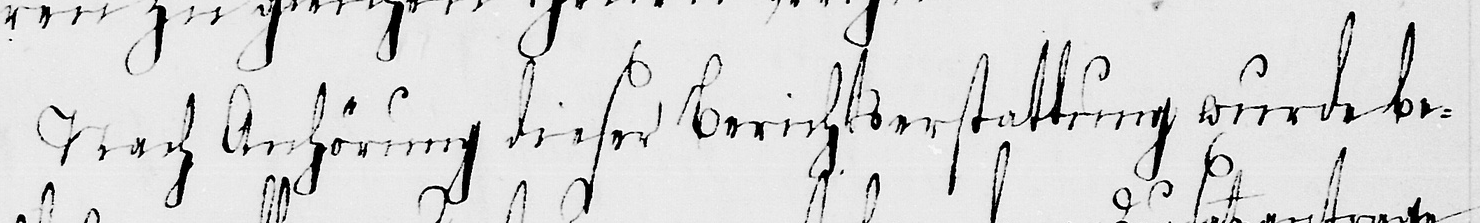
Nach Anhörung dieser Berichterstattung wurde be¬
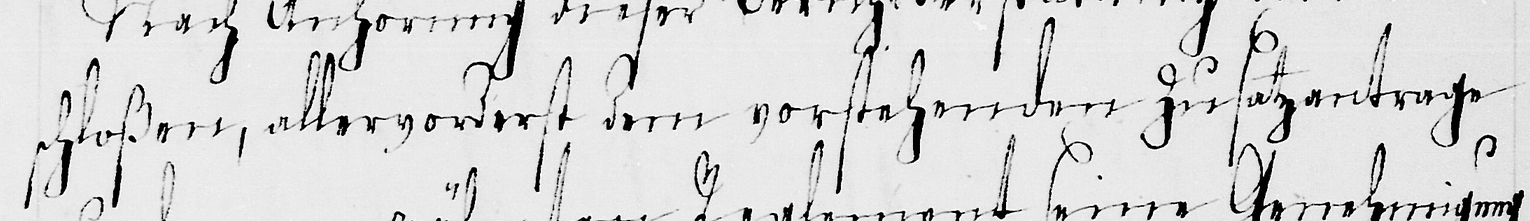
schloßen, allervorderst dem vorstehenden Zusatzantrage
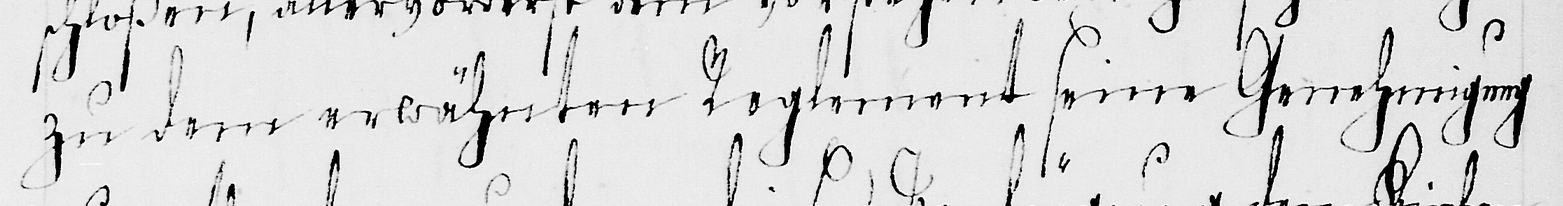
zu dem erwähnten Reglement seine Genehmigung
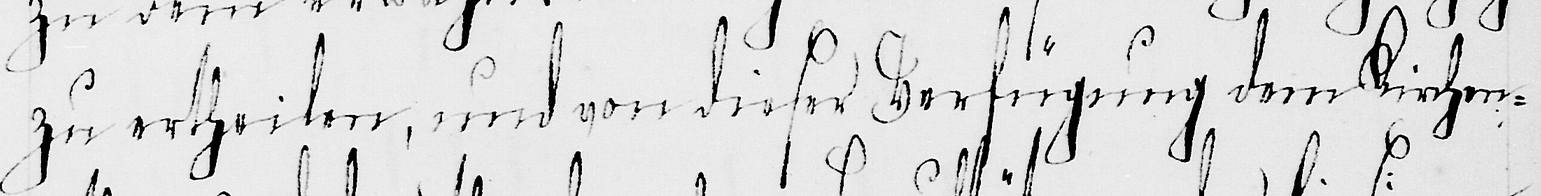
zu ertheilen, und von dieser Verfügung dem Kirchen¬
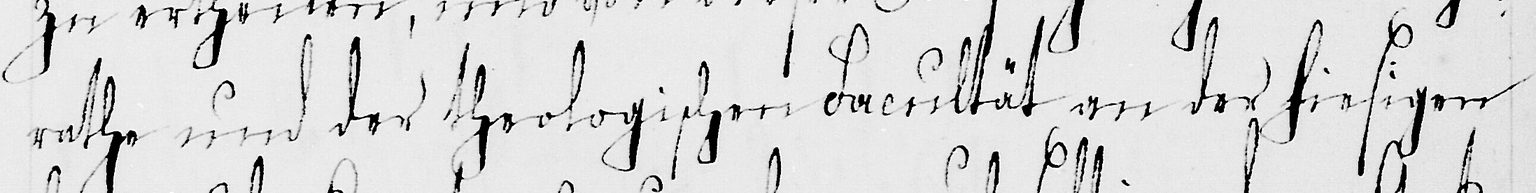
rathe und der theologischen Facultät an der hiesigen
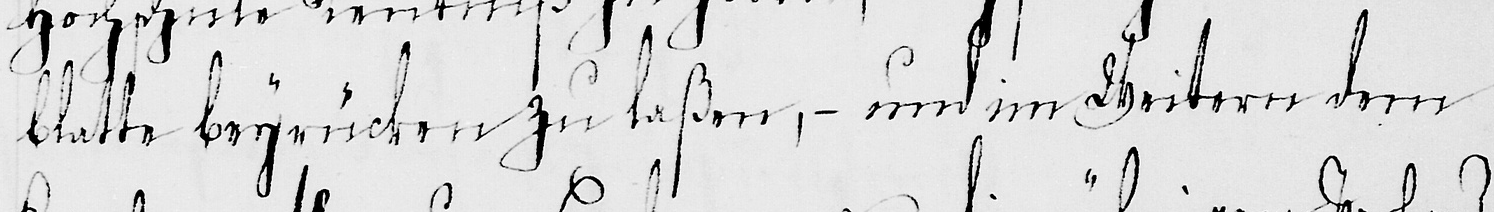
blatte beyrücken zu laßen, – und im Weitern dem
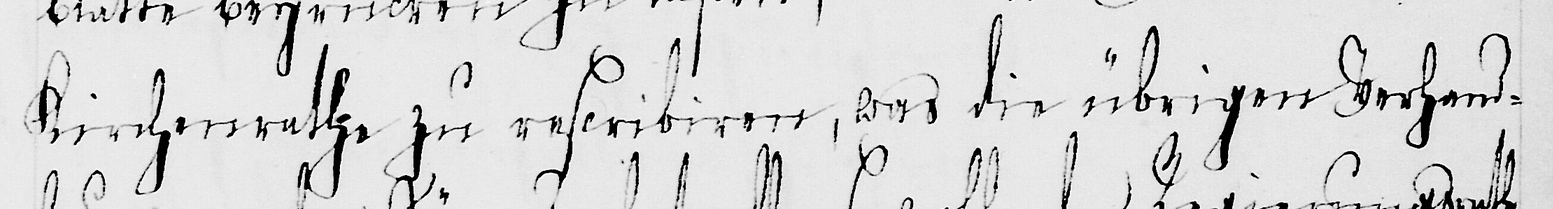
Kirchenrathe zu rescribiren, was die übrigen Verhand¬
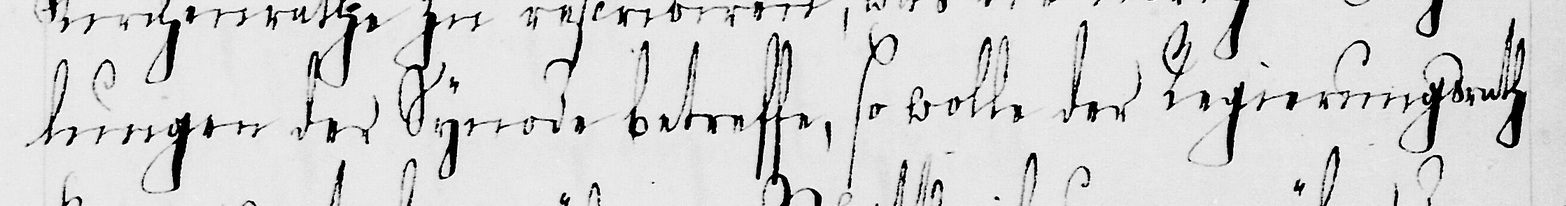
lungen der Synode betreffe, so wolle der Regierungsrath
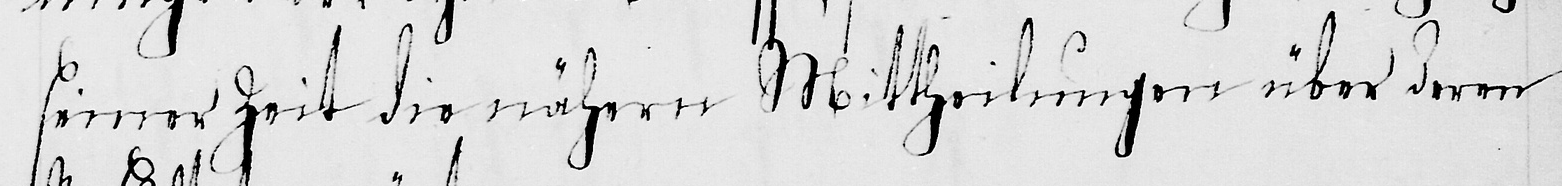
seiner Zeit die nähern Mittheilungen über deren
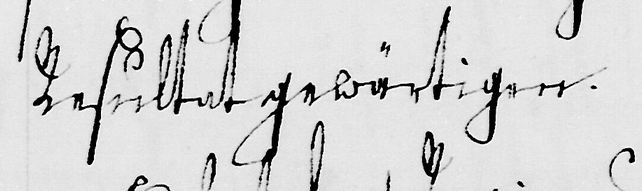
Resultat gewärtigen.
